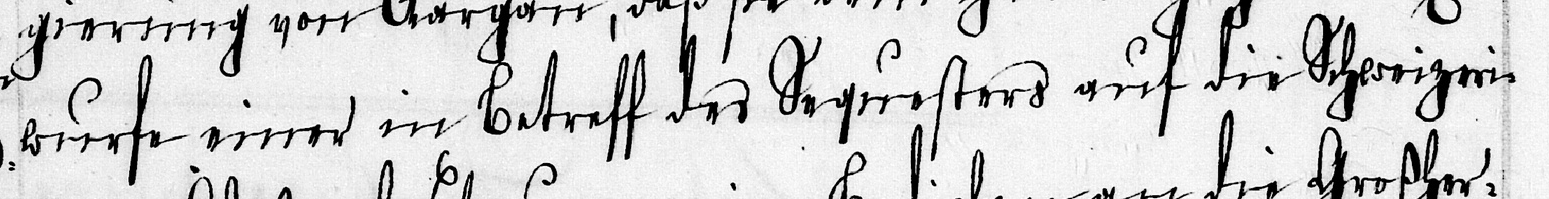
wurfe einer in Betreff des Sequesters auf die Schweizeri¬
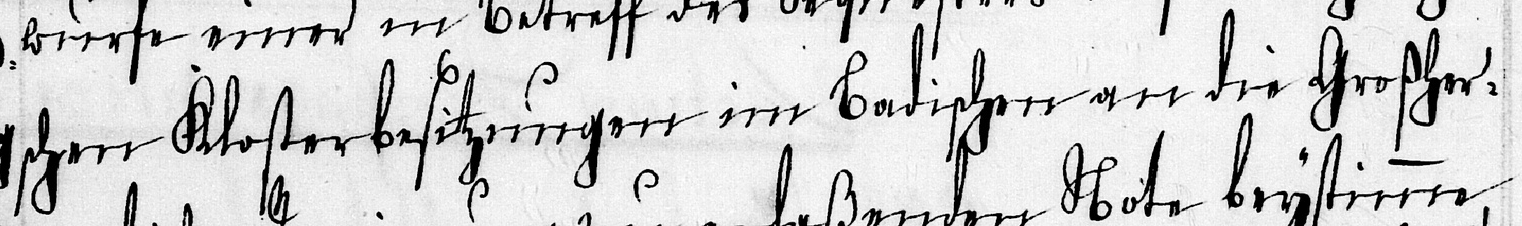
schen Klosterbesitzungen im Badischen an die Großher¬
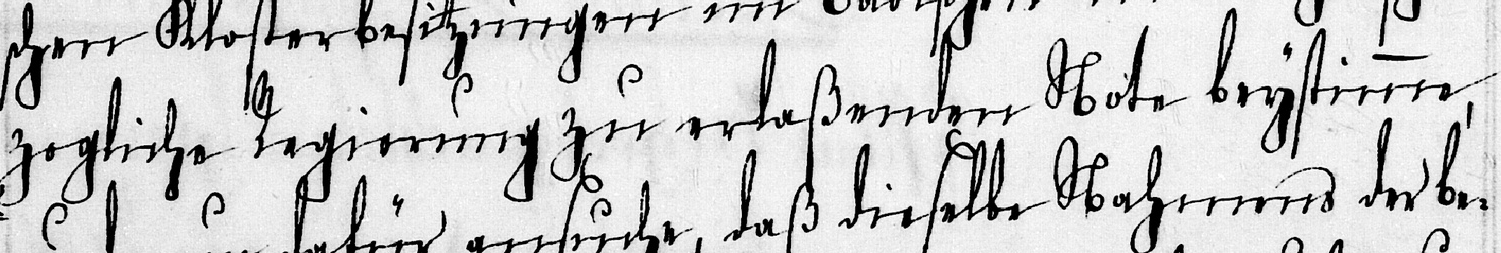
zogliche Regierung zu erlaßenden Note beystimme,
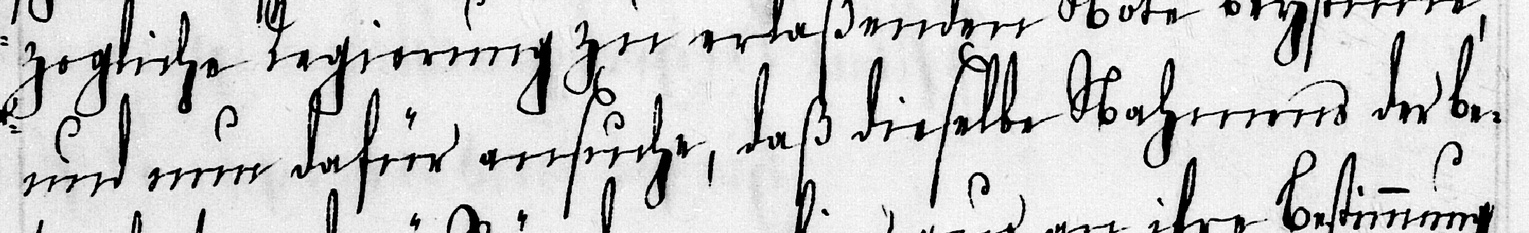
und nun dafür ansuche, daß dieselbe Nahmens der be¬
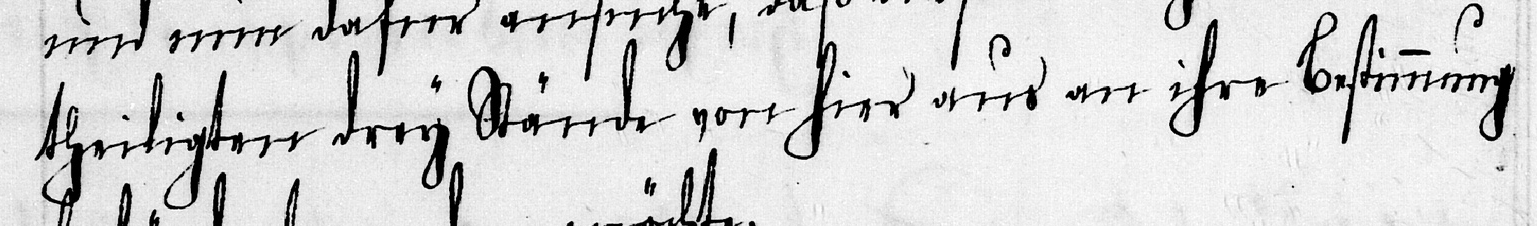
theiligten drey Stände von hier aus an ihre Bestimmung
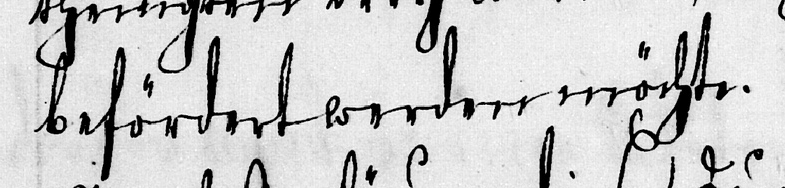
befördert werden möchte.
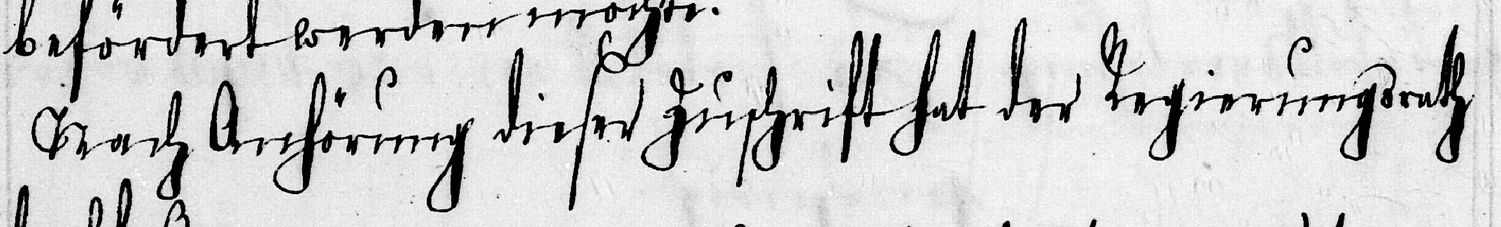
Nach Anhörung dieser Zuschrift hat der Regierungsrath
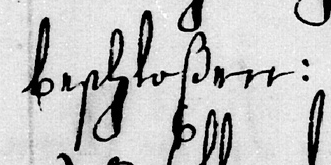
beschloßen:
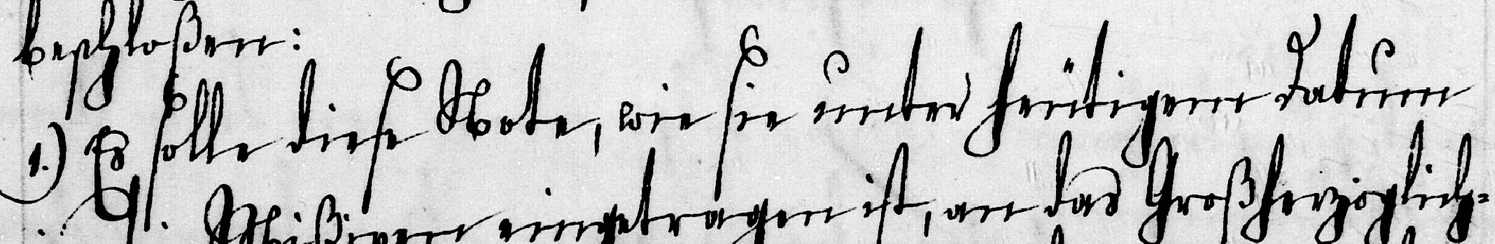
Es solle diese Note, wie sie unter heutigem Datum
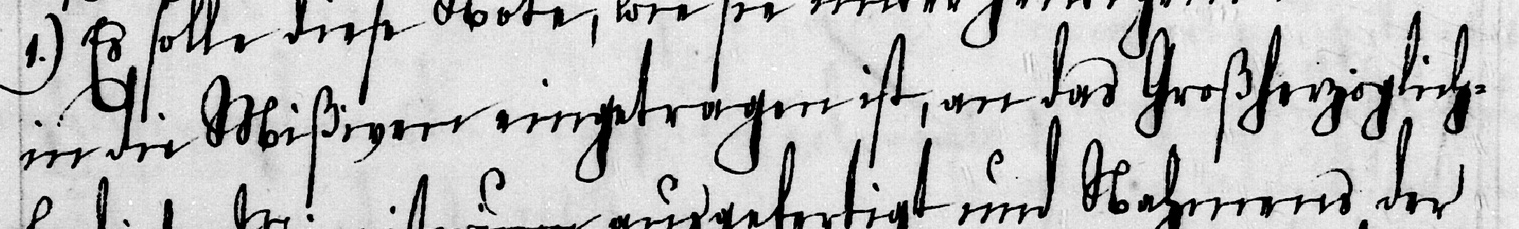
in die Mißiven eingetragen ist, an das Großherzoglic¬
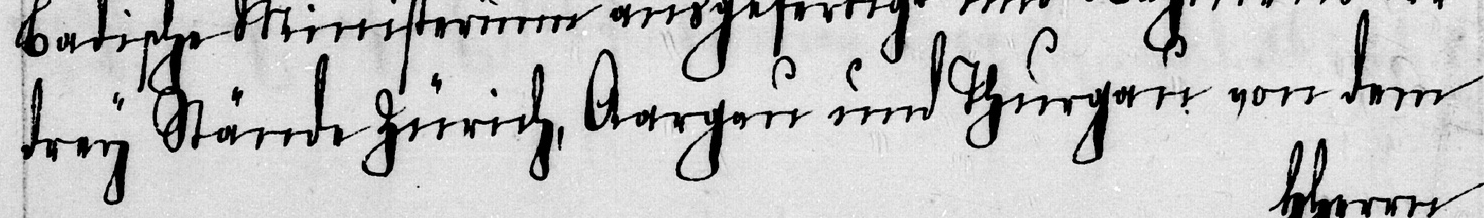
drey Stände Zürich, Aargau und Thurgau von dem
